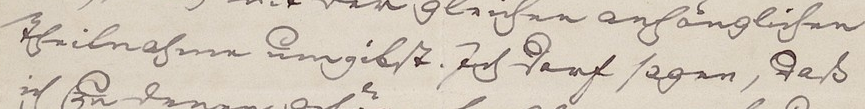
Theilnahme umgibst. Ich darf sagen, daß
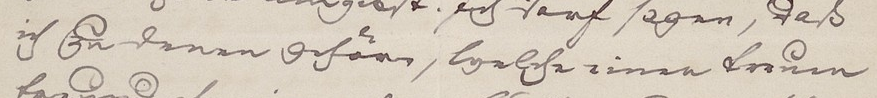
ich zu denen gehöre, welche einen treuen
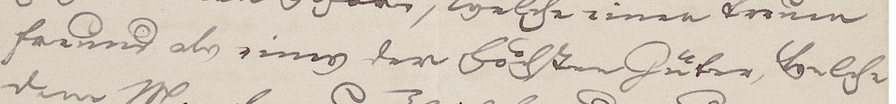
Freund als eines der höchsten Güter, welche
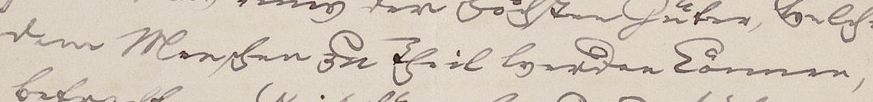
dem Menschen zu Theil werden können,
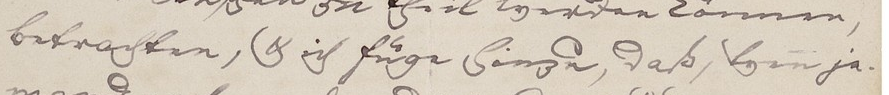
betrachten, & ich füge hinzu, daß, wenn je-
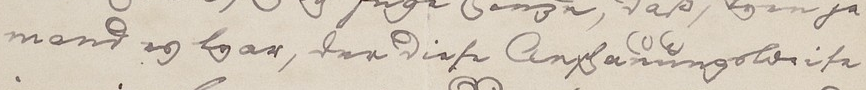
mand es war, der diese Anschauungsweise
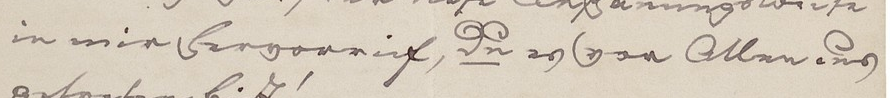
in mir hervorrief, Du es von Allen aus
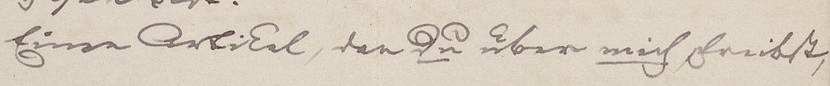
Einen Artikel, den Du über mich schreibst,
